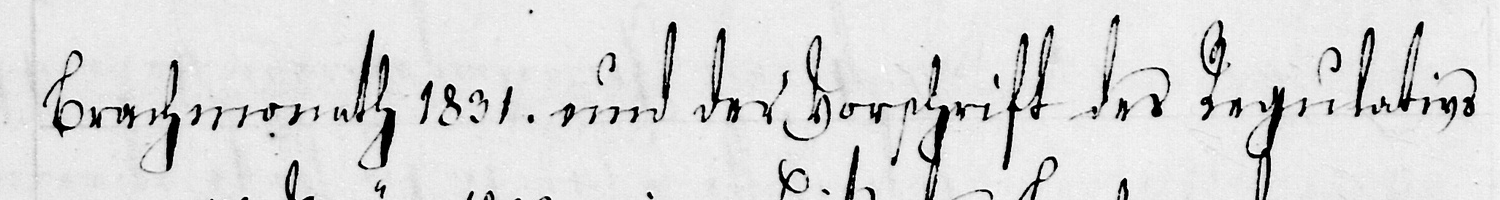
Brachmonath 1831. und der Vorschrift des Regulativs
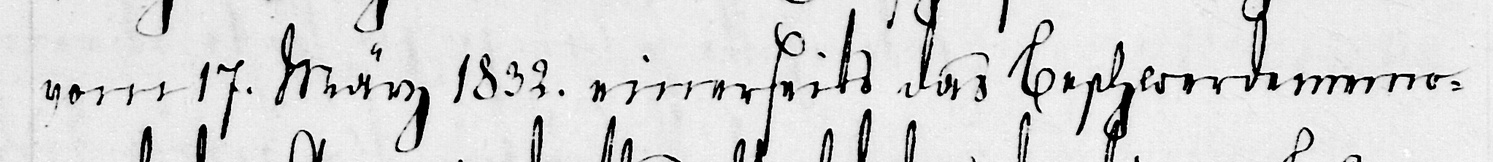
vom 17. März 1832. einerseits das Beschwerdememo¬
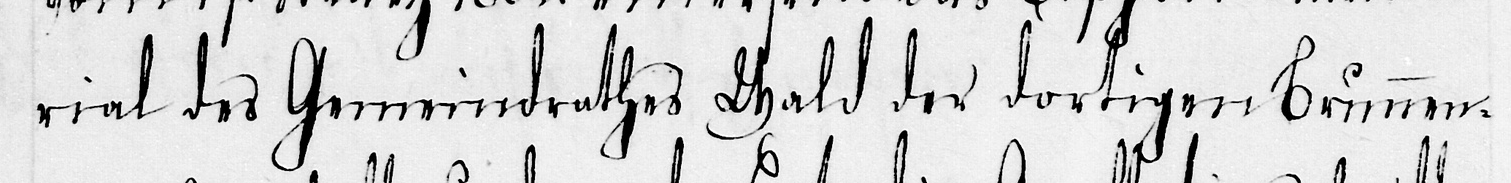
rial des Gemeindrathes Wald der dortigen Brunnen¬
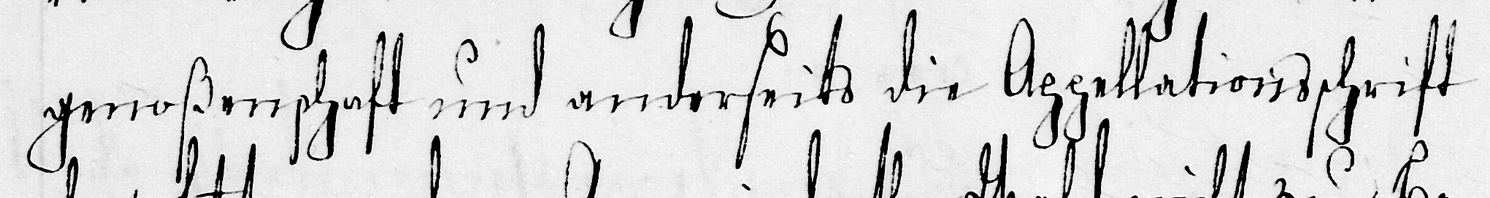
genoßenschaft und anderseits die Appellationsschrift
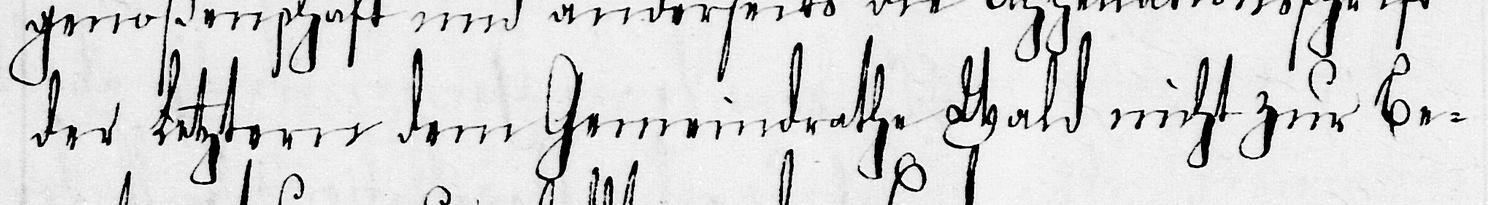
der Letztern dem Gemeindrathe Wald nicht zur Be¬
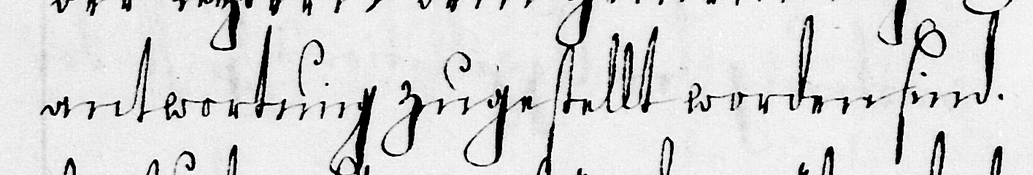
antwortung zugestellt worden sind.
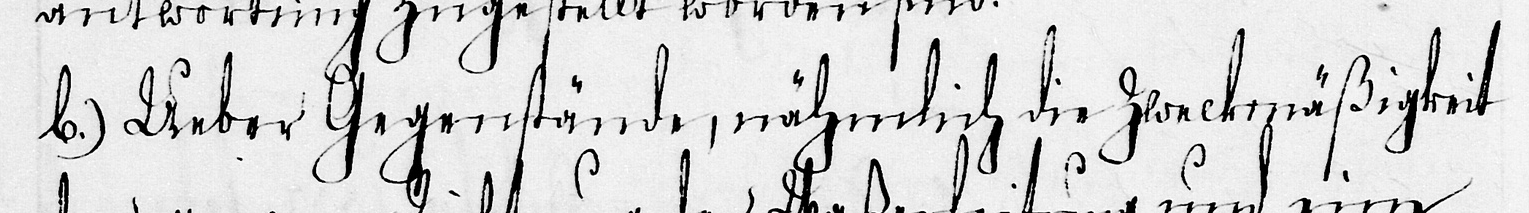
b.) Ueber Gegenstände, nähmlich die Zweckmäßigkeit
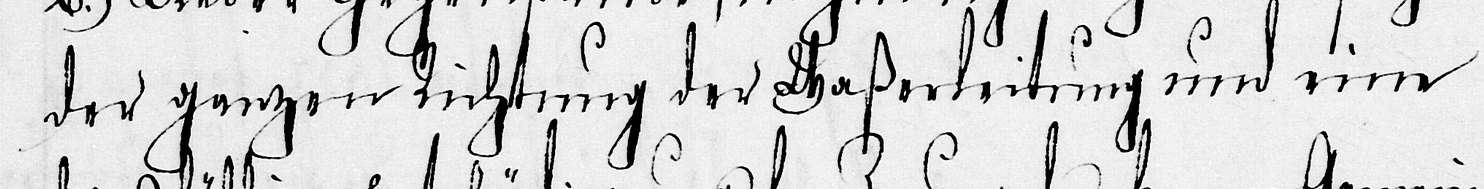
der ganzen Richtung der Waßerleitung und eine
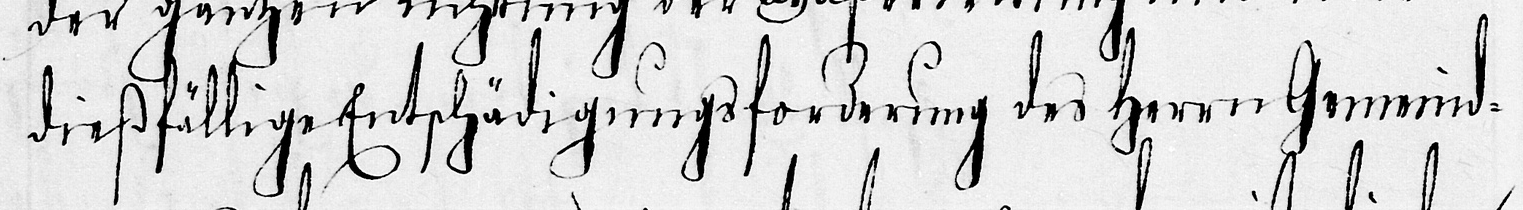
dießfällige Entschädigungsforderung des Herrn Gemeind¬
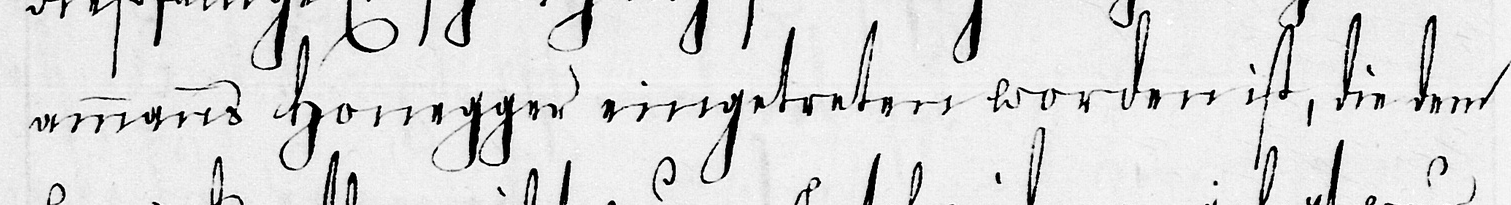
ammanns Honegger eingetreten worden ist, die dem
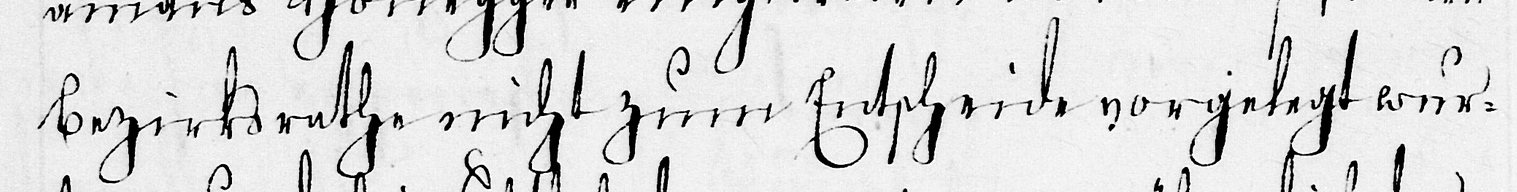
Bezirksrathe nicht zum Entscheide vorgelegt wur¬
